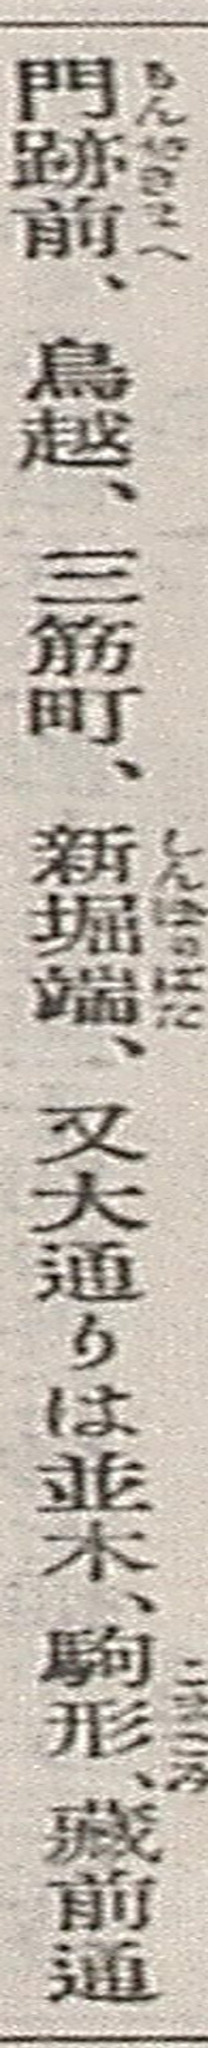門跡前、鳥越、三筋町、新堀端、又大通りは並木、駒形、蔵前通
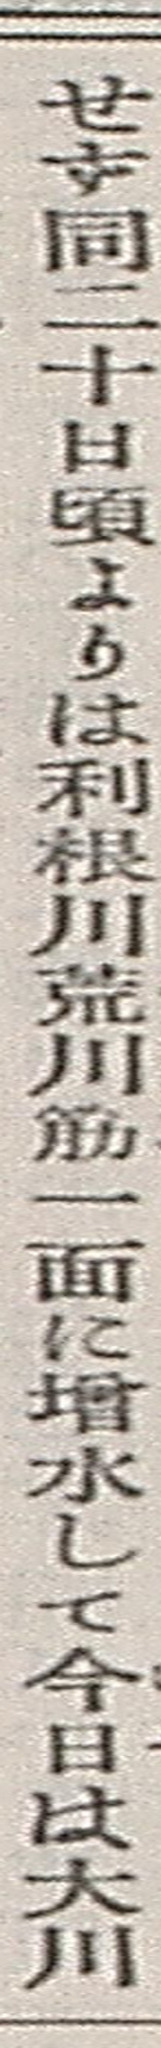せず同二十日頃よりは利根川荒川筋一面に増水して今日は大川
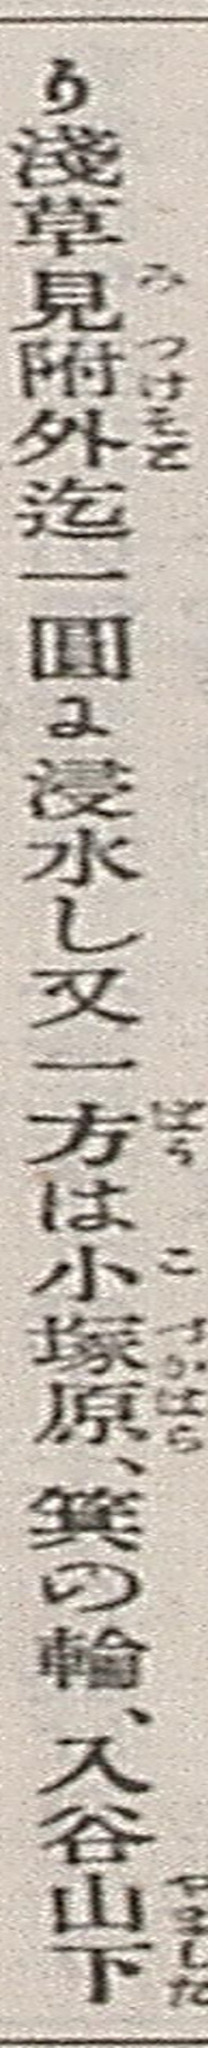り浅草見附外迄一円に浸水し又一方は小塚原、箕の輪、入谷山下
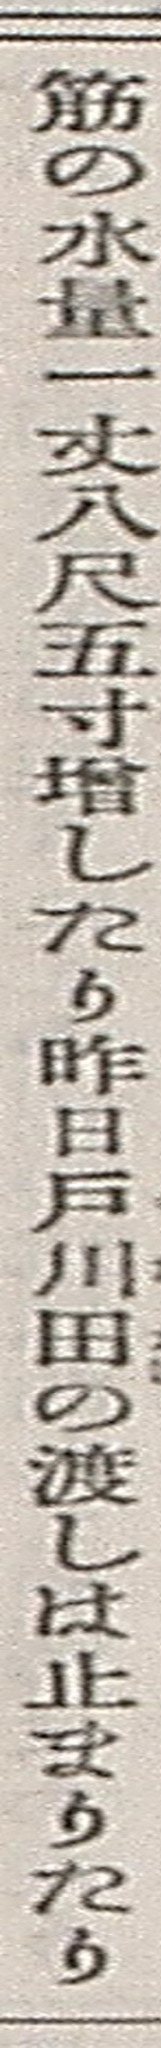筋の水量一丈八尺五寸増したり昨日戸田川の渡しは止まりたり
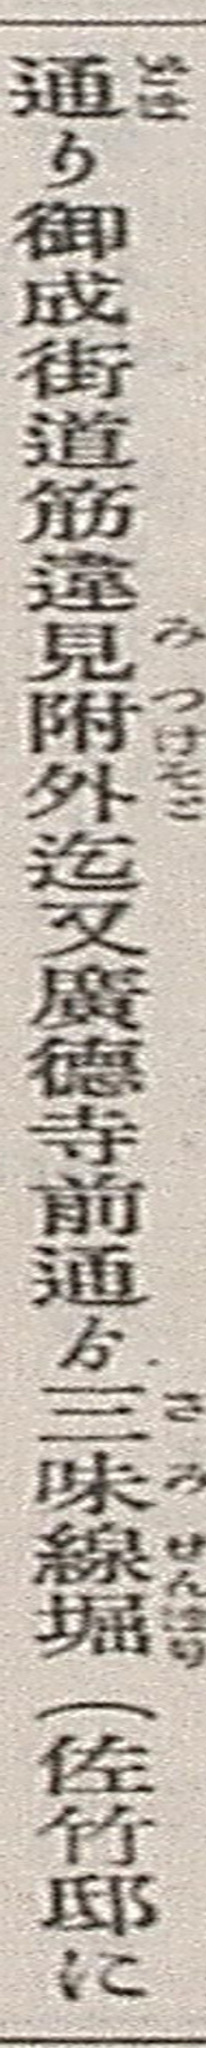通り御成街道筋違見附外迄又広徳寺前通ゟ三味線堀（佐竹邸に
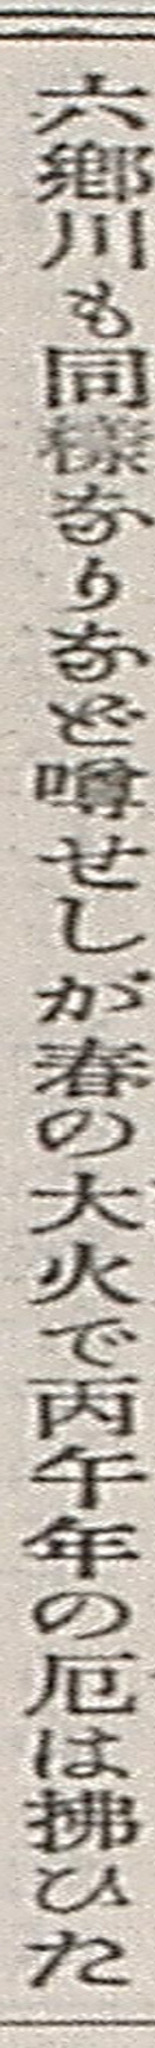六郷川も同様なりなど噂せしが春の大火で丙午年の厄は払ひた
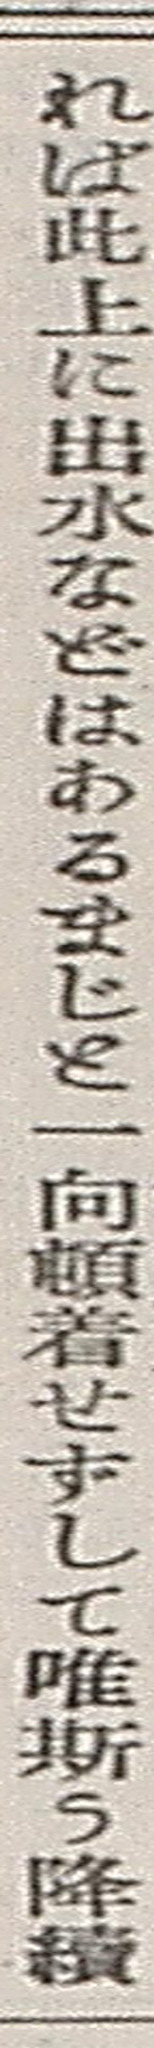れば此上に出水などはあるまじと一向頓着せずして唯斯う降続
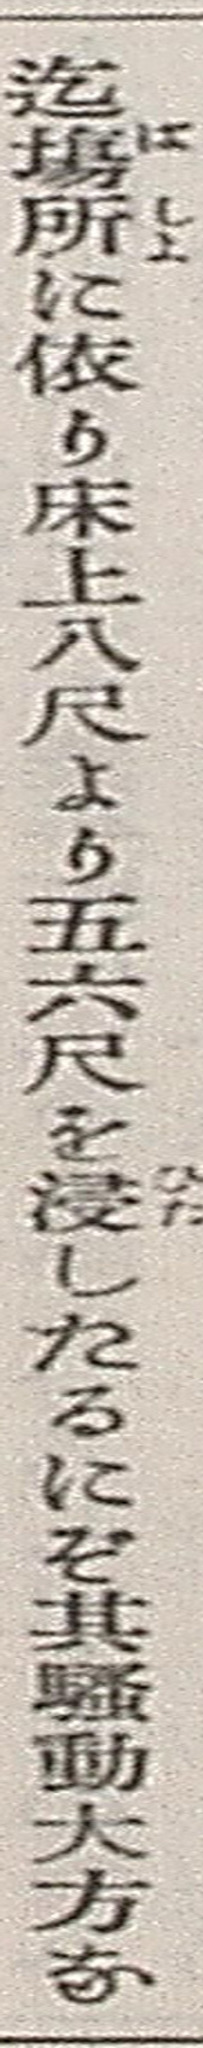迄場所に依り床上八尺より五六尺を浸したるにぞ其騒動大方な
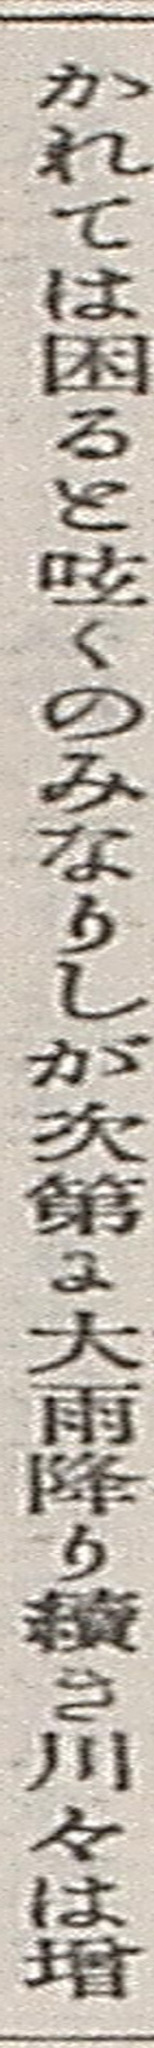かれては困ると呟くのみなりしが次第に大雨降り続き川々は増
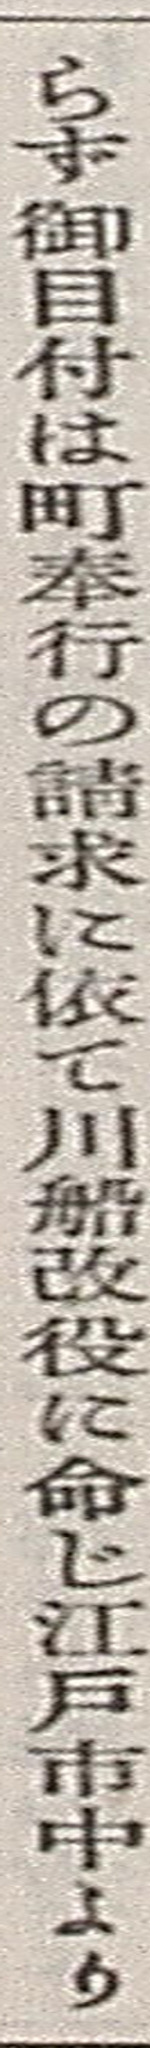らず御目付は町奉行の請求に依て川船改役に命じ江戸地中より
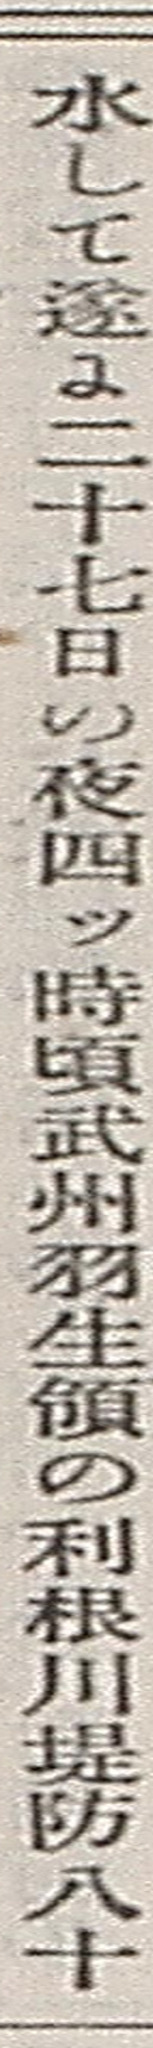水して遂に二十七日の夜四ツ時頃武州羽生領の利根川堤防八十
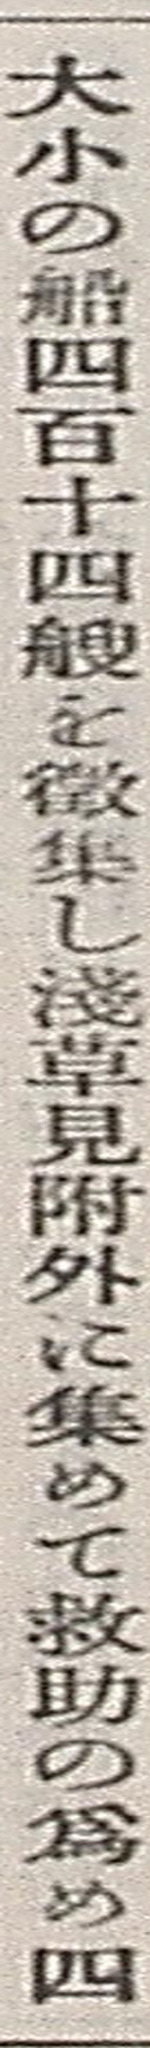大小の船四百十四艘を徴集し浅草見附外に集めて救助の為め四
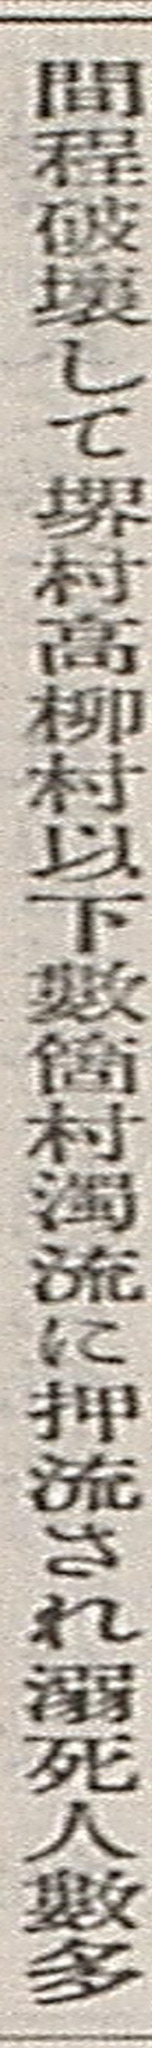間程破壊して堺村高柳村以下数箇村濁流に押流され溺死人数多
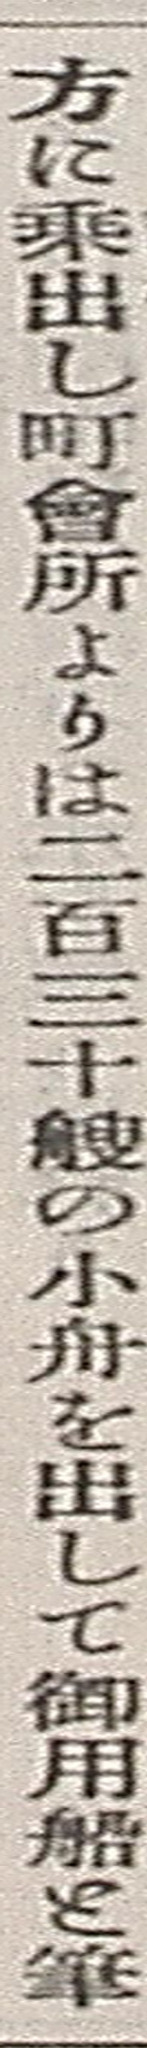方に乗出し町会所よりは二百三十艘の小舟を出して御用船と筆
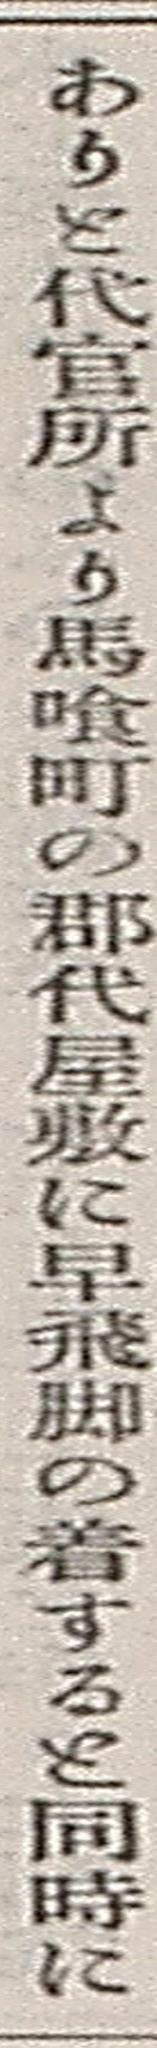ありと代官所より馬喰町の郡代屋敷に早飛脚の着すると同時に
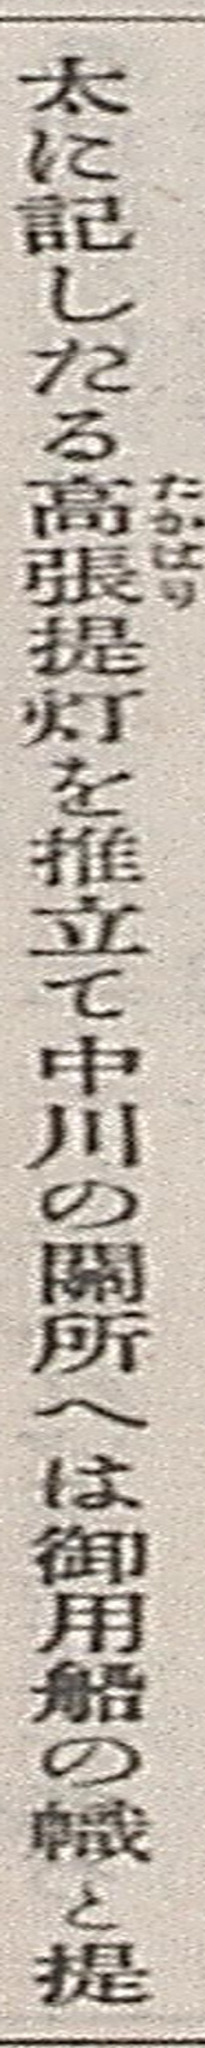太に記したる高張提灯を推立て中川の関所へは御用船の幟と提
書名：風俗畫報臨時増刊第百二十四號　洪水地震被害録（上）
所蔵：東京大学地震研究所図書室 Earthquake Research Institute Library, The University of Tokyo, JAPAN
